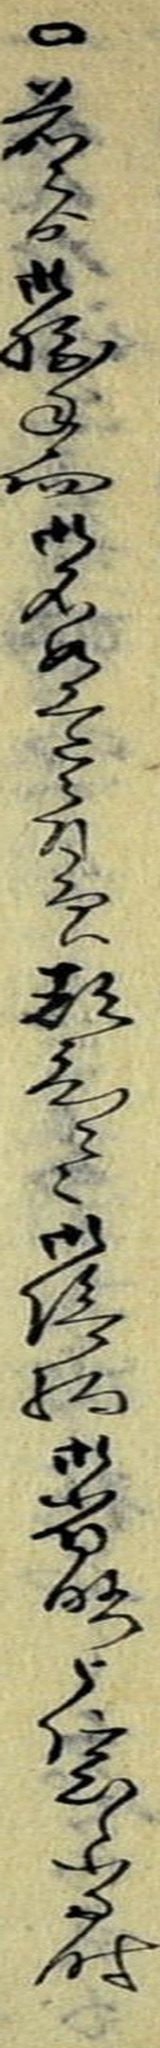○前々ゟ御勝手向御不如意に付而は都度々々御倹約御省略被仰出候当時
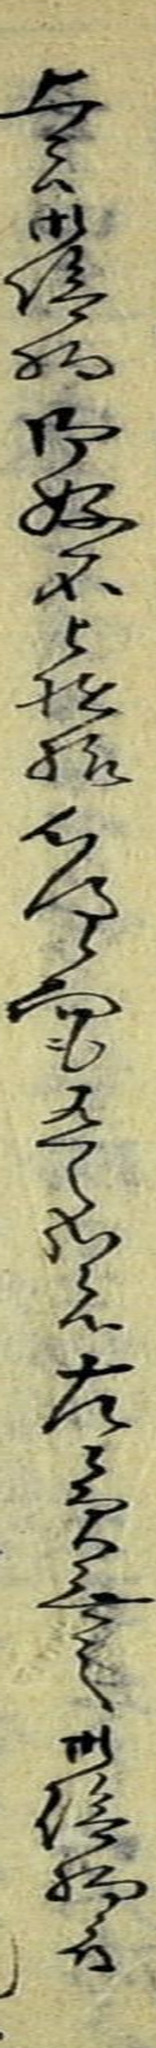上には御倹約御好不被遊様心得之向も有之哉に候左候而は無之御倹約に付
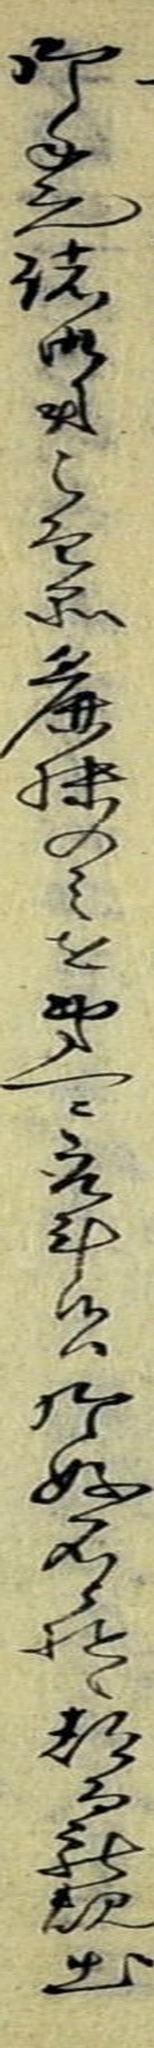御手元諸御用之色品麁抹のミを第一に取斗候は御好不被遊候都而新規出
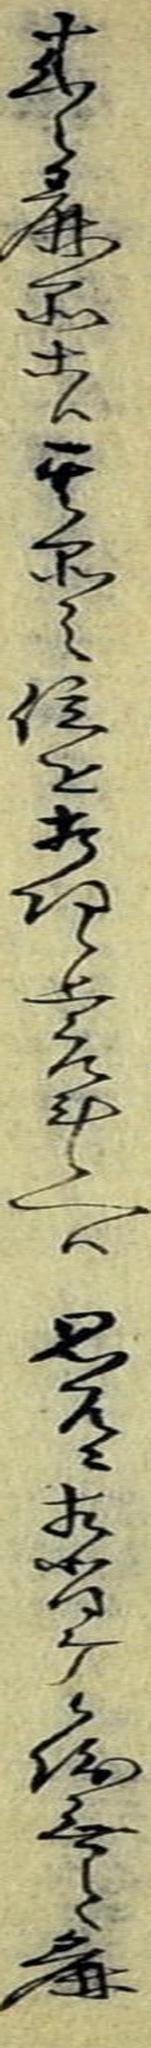来候麁品等は其品之位を相伺候上取斗候へは思召に相背ヶ候儀無之麁
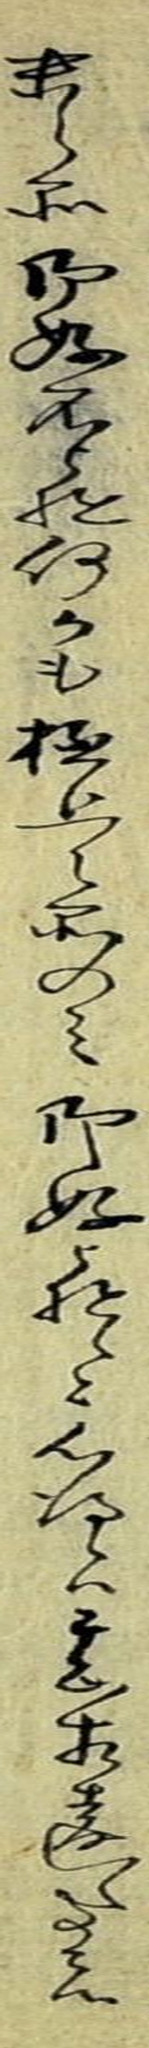末之品御好不被遊何クも極上之品のミ御好被遊候之心得には甚相違候事に候
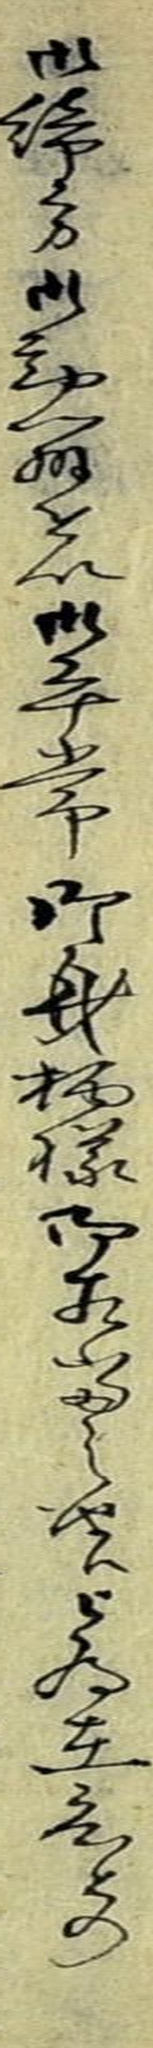御締方御勘弁を以御平常御身柄様御相当之儀は被為在度との
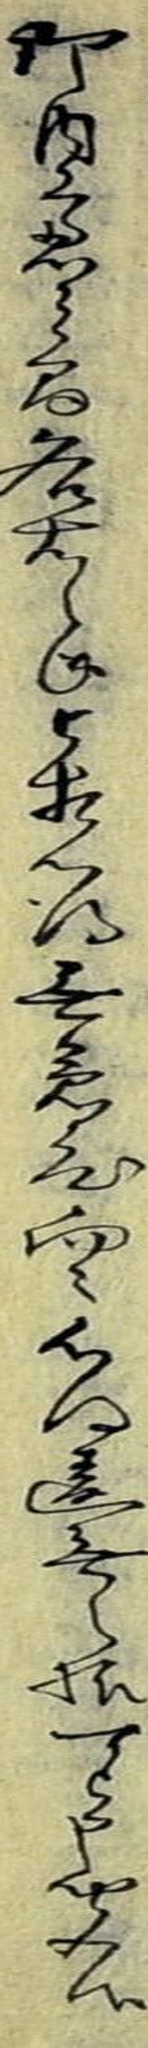御内慮に候間各右之趣被相心得無急度向々心得違無之様可被申聞候
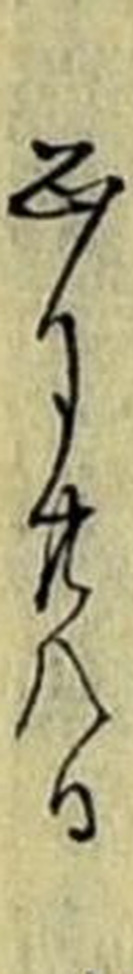正月廿一日
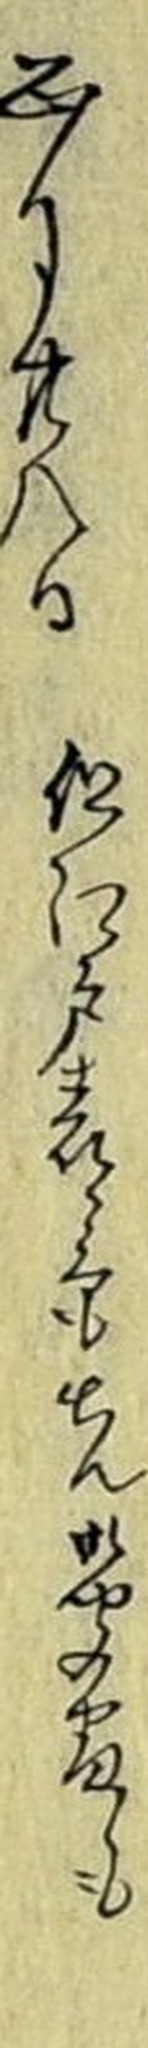正月廿八日但江戸表に而も先御聞番へも
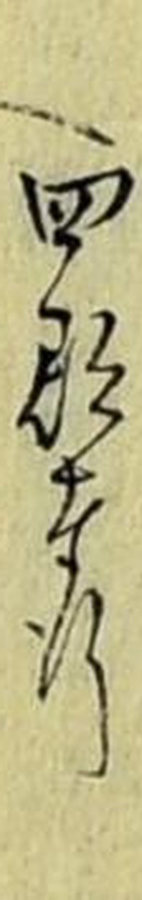四郡奉行
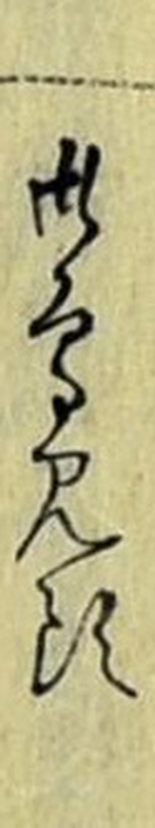御鳥見頭
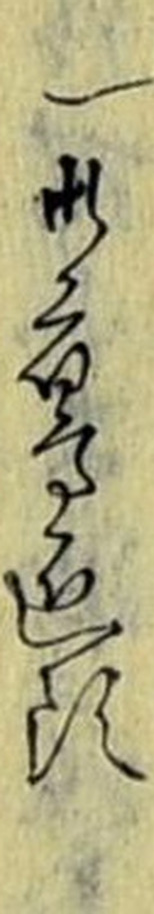御鷹匠頭
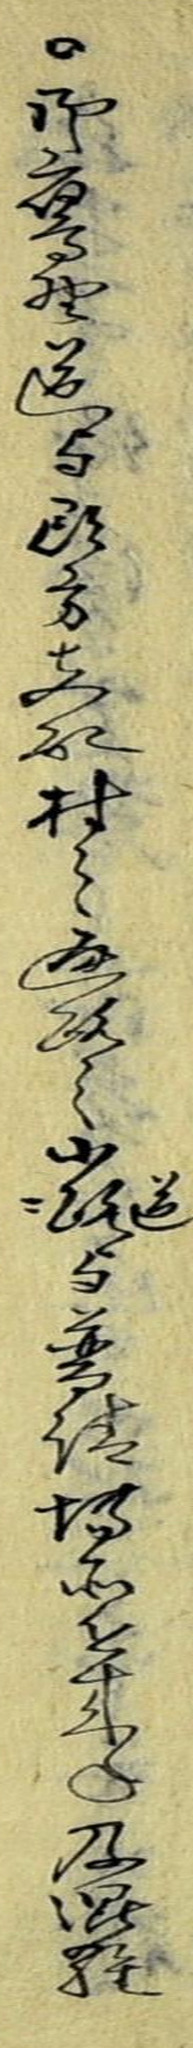○御鷹野道と郡方支配村々之通路之小路と普請場所近来年及混雑

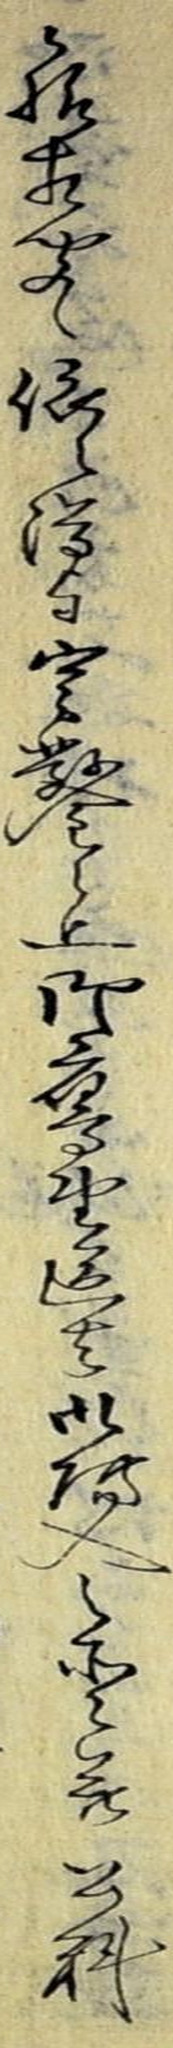候様相聞候依之得と穿鑿之上御鷹野道は御場入之所々并公料
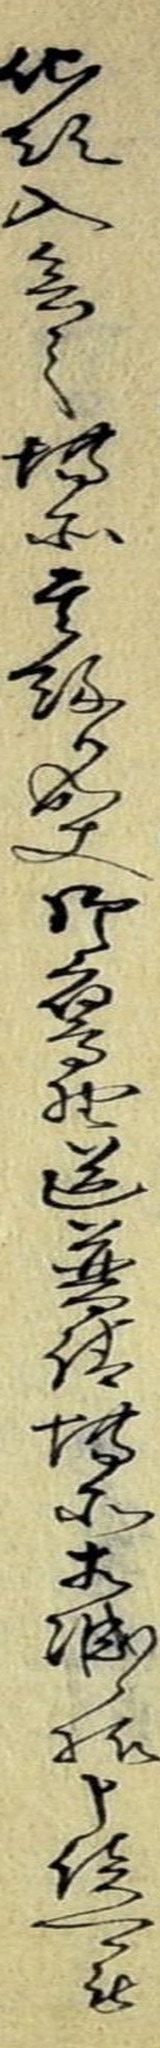他領入会之場所其餘は成丈御鷹野路普請場所相減候様申談可被
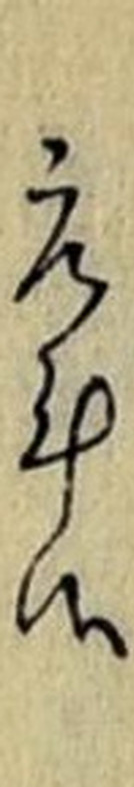取斗候
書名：命令之部 四
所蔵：福井県文書館 Fukui Prefectural Archives
